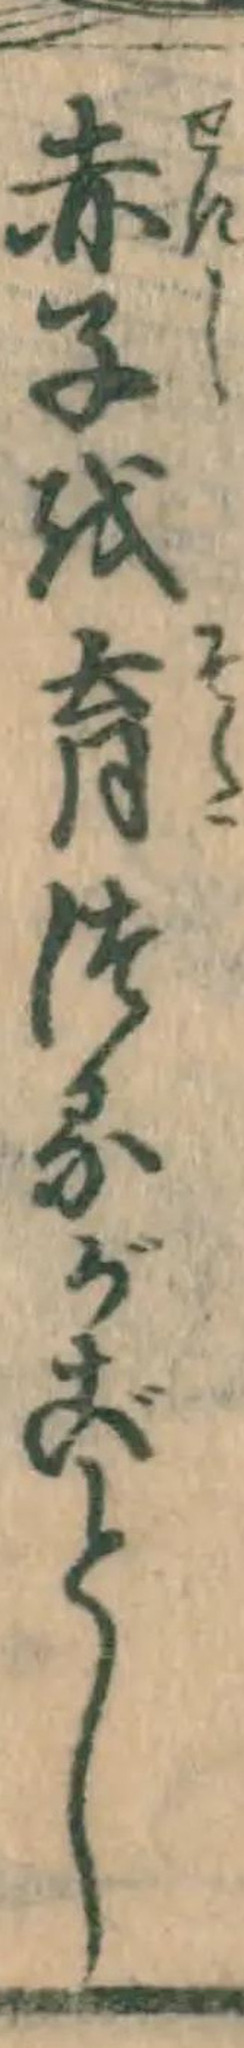赤子を育つるがごとし
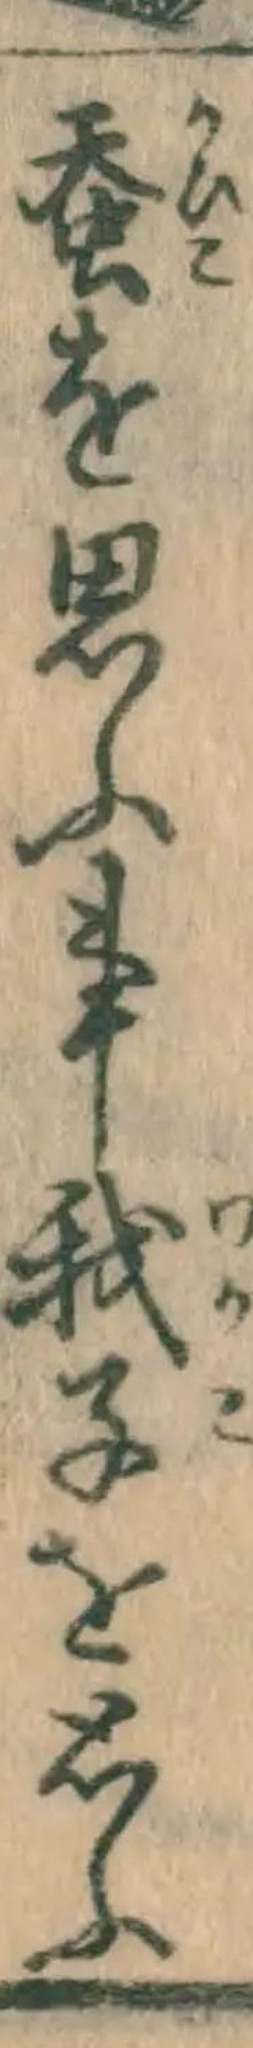蚕を思ふ事我子を思ふ
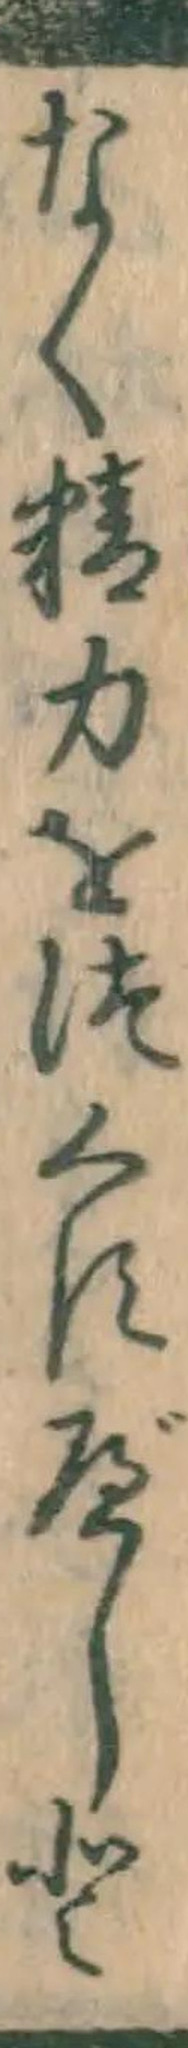なく精力をつくすべしと
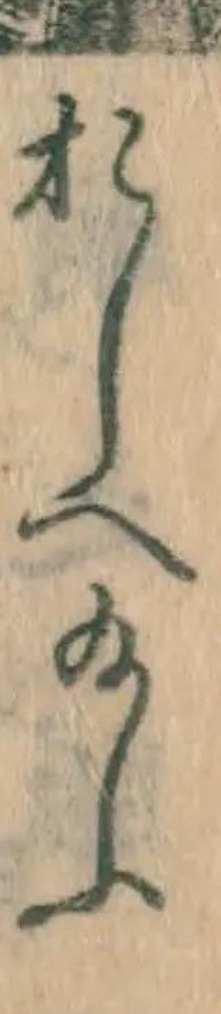おしへ給ふ
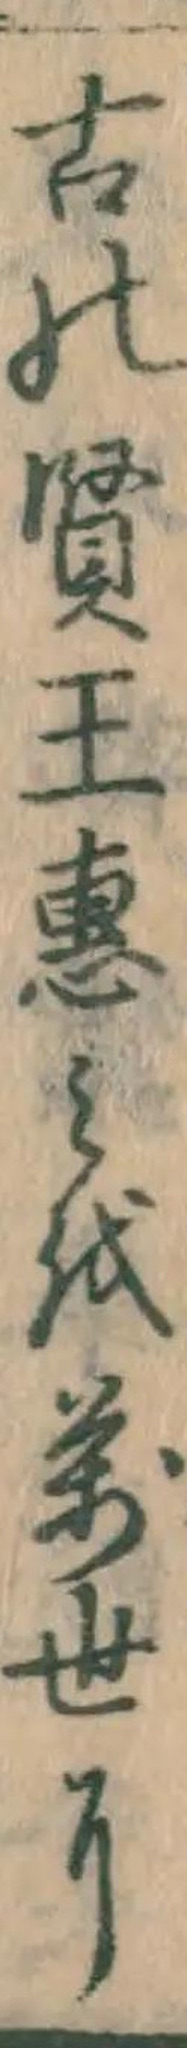古の賢王恵みを万世に
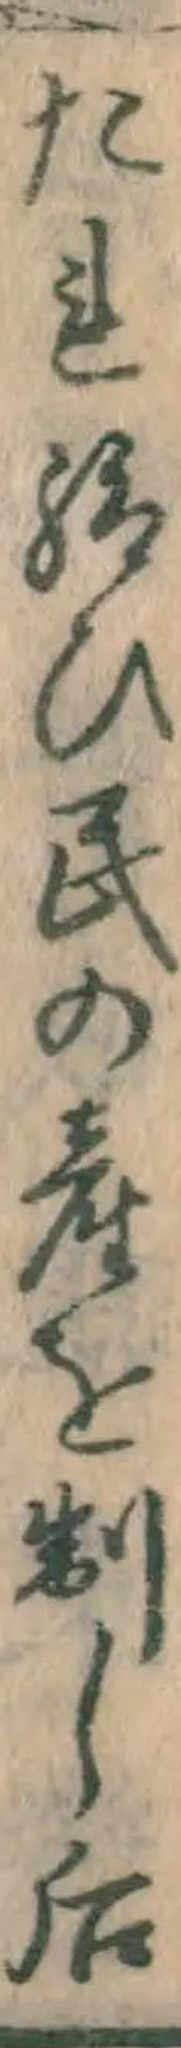たれ給ひ民の産を制し后
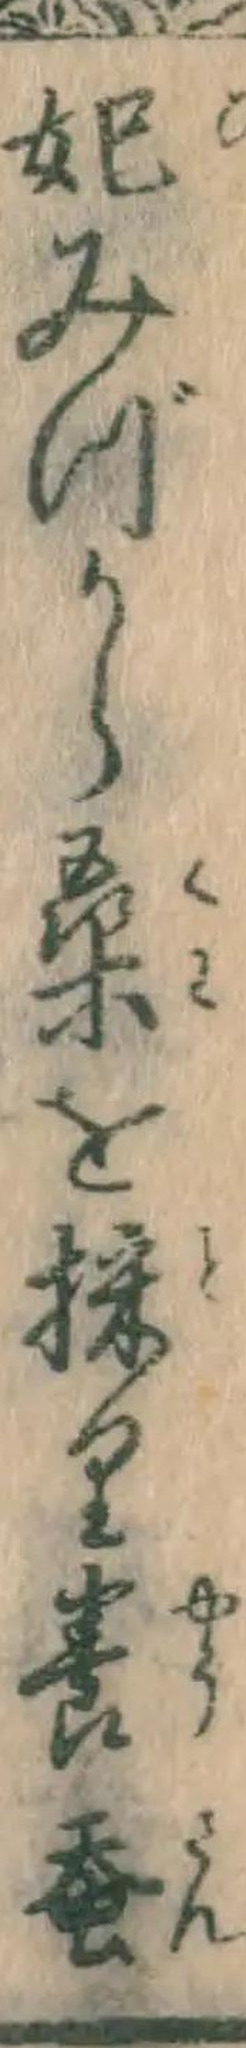妃みづから桑を採り養蚕
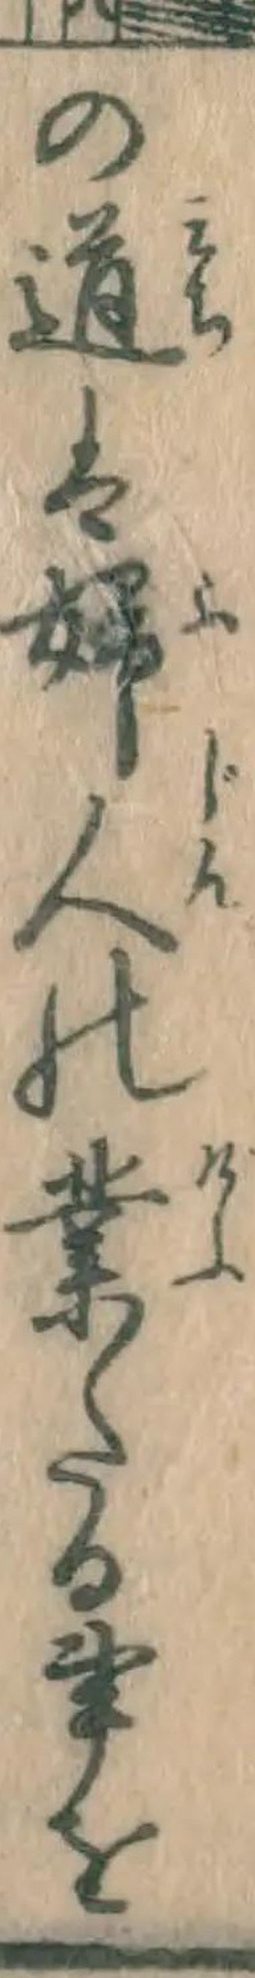の道は婦人の業たる事を
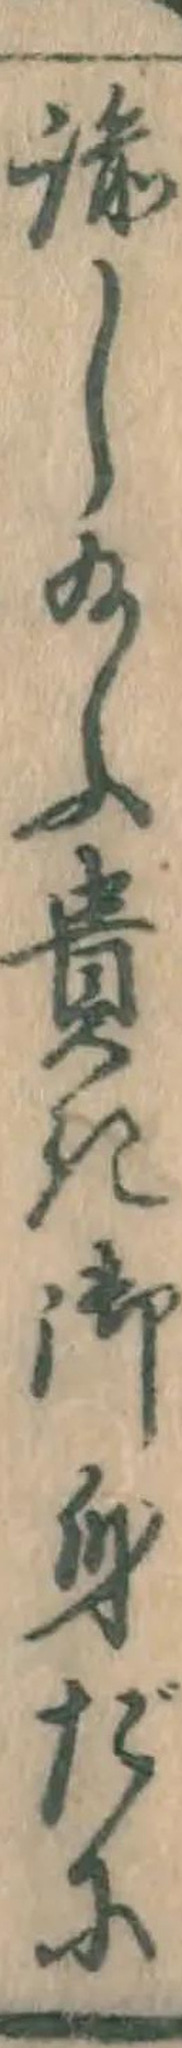諭し給ふ貴き御身だに
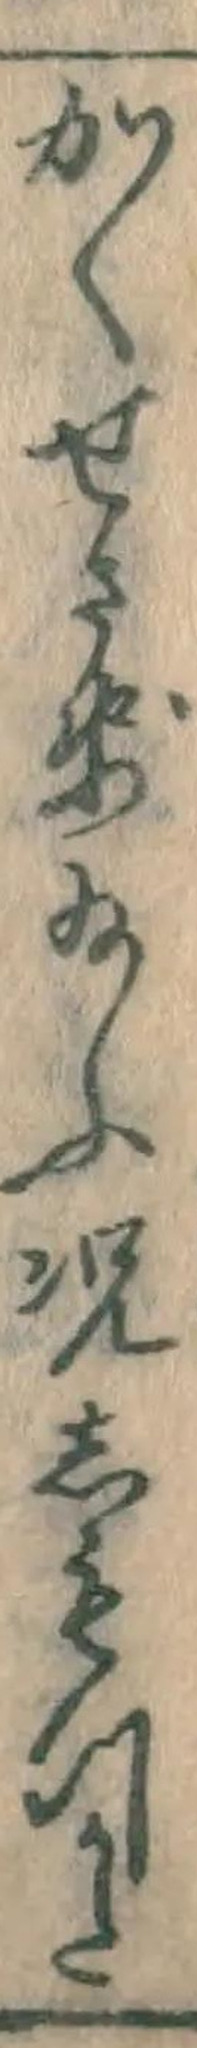かくせさせ給ふ況しもつかた
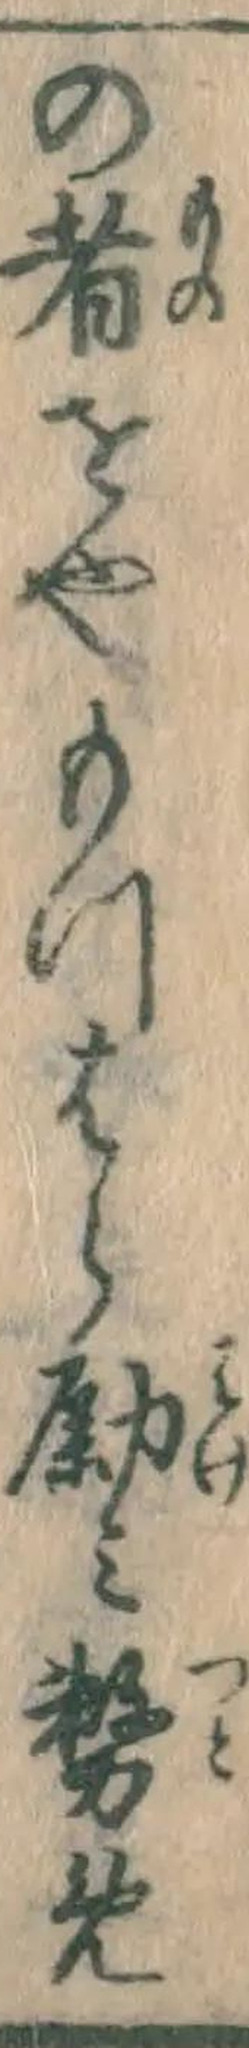の者をやもつはら励み務め
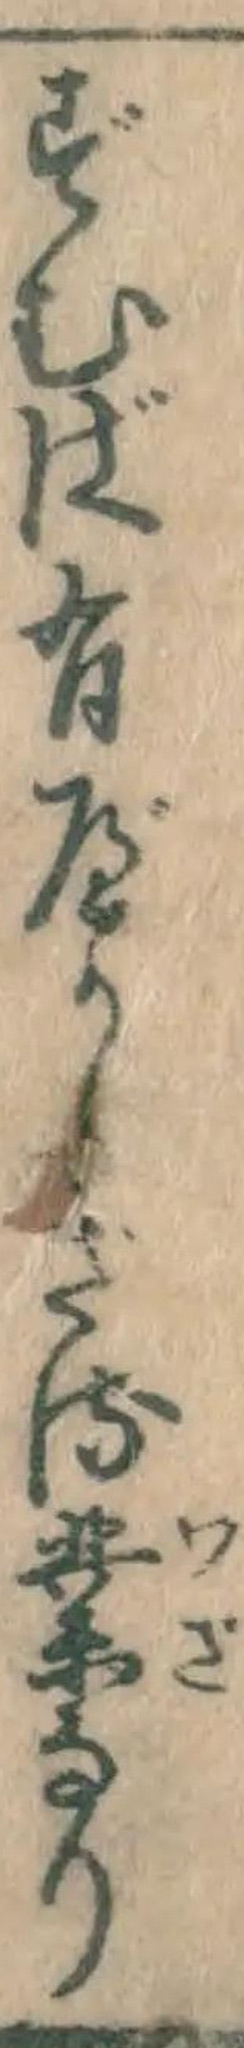ずむば有べからざる業なり

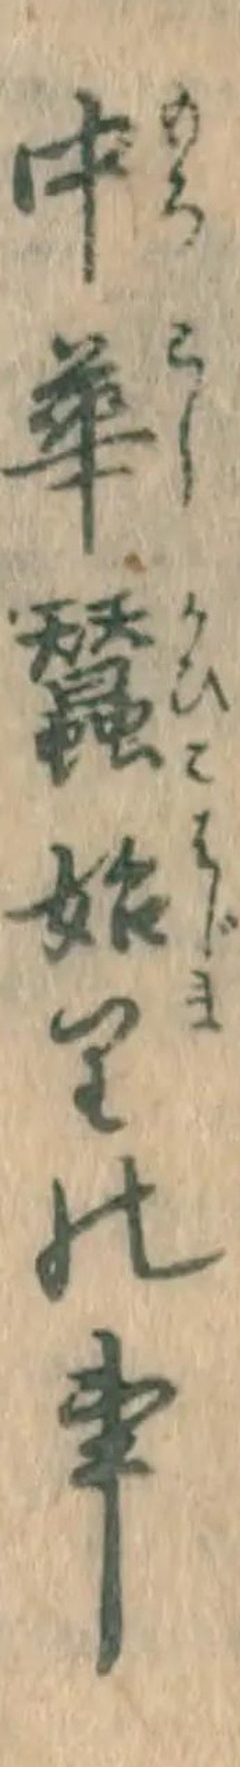中華蚕始りの事
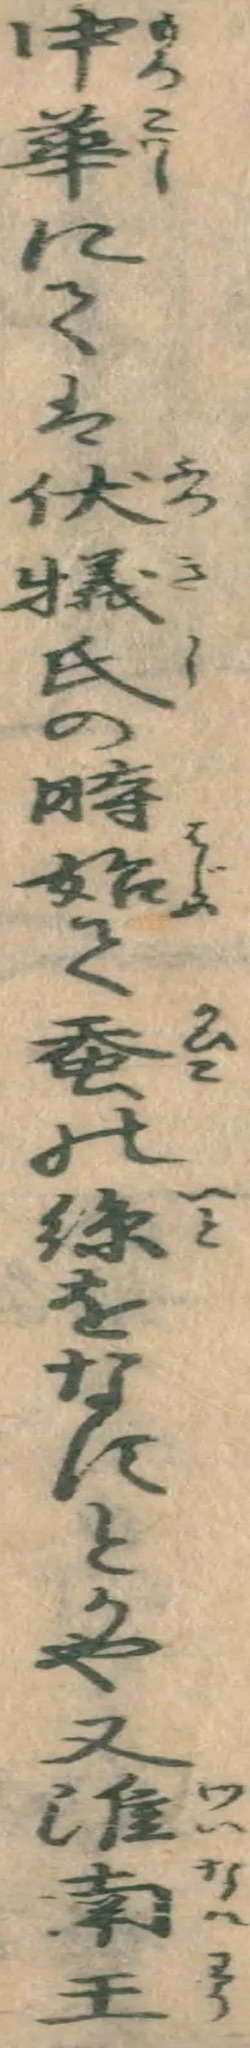中華にては伏犧氏の時始て蚕の糸をなすとかや又淮南王
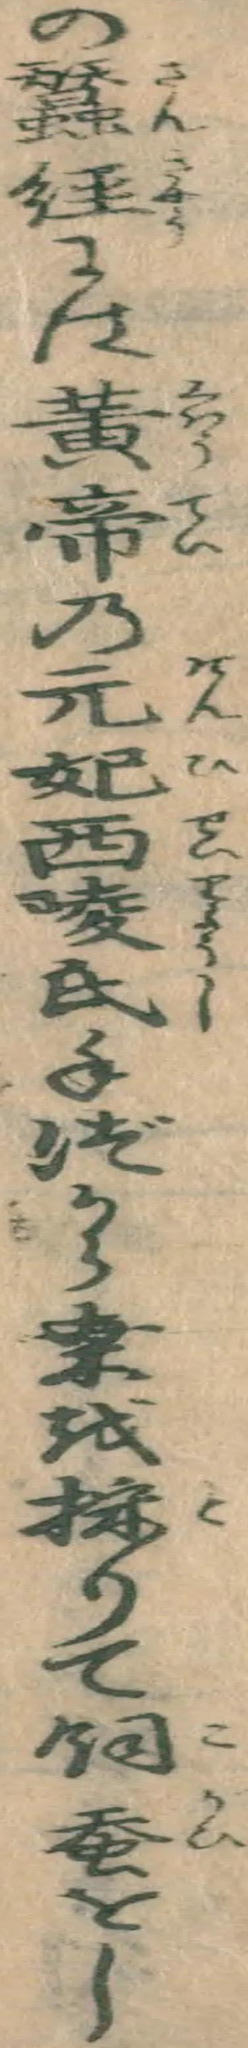の蚕経には黄帝の元妃西陵氏手づから桑を採りて飼蚕をし
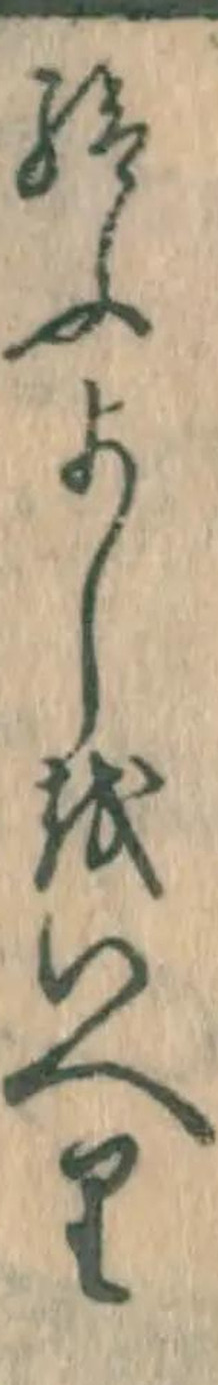給ふよしをいへり
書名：養蚕秘録 3巻. [1]
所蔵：国立国会図書館 National Diet Library, JAPAN
